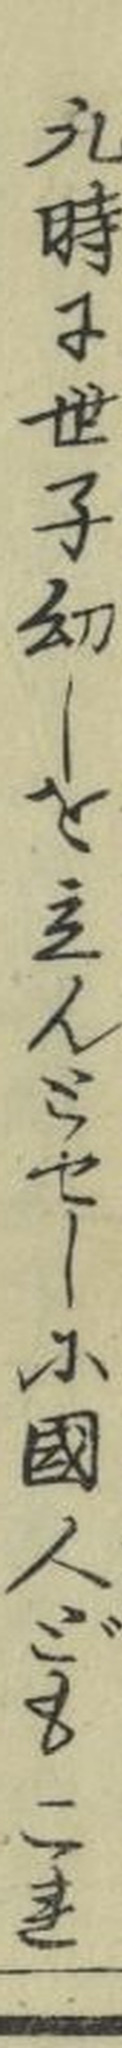九時に、世子幼しを立んとせしに、国人どもこれ
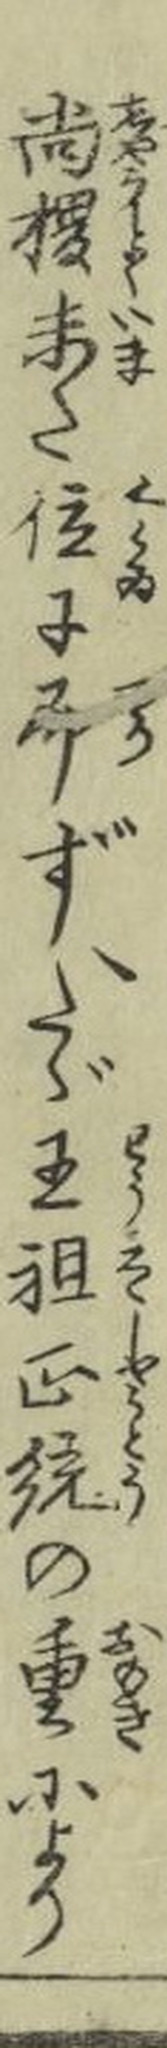尚稷未た位に即ず、たゞ王祖正統の重により
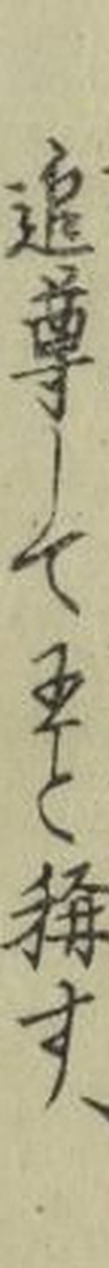追尊して王と称す、

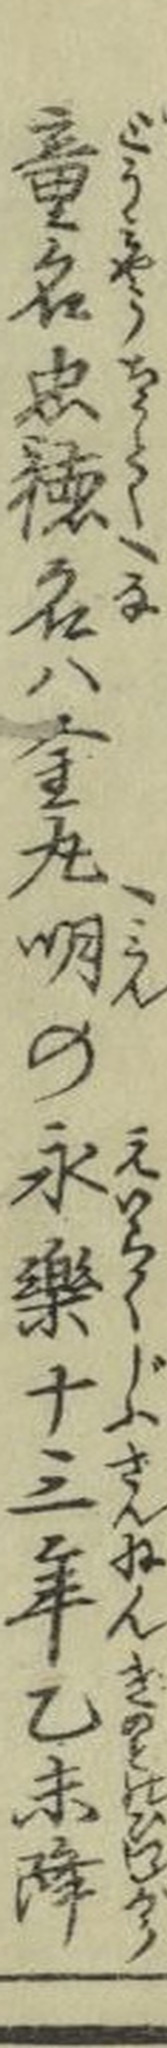童名忠徳、名は金丸、明の永楽十三年乙未降
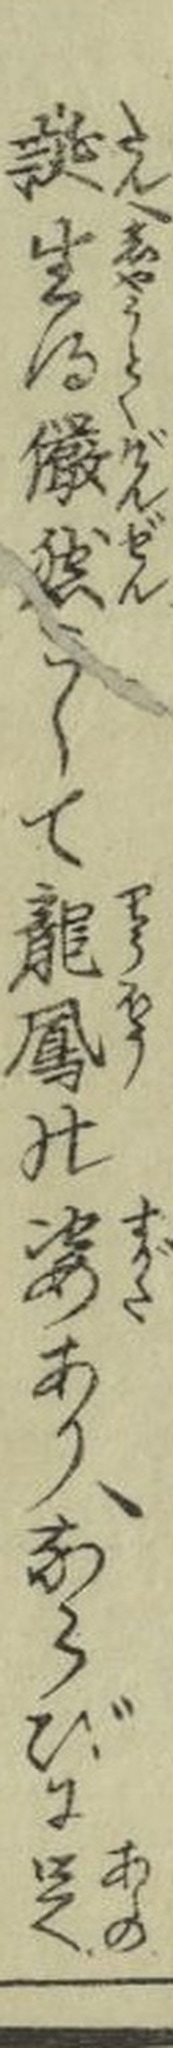誕、生得儼然として龍鳳の姿あり、ならびに足
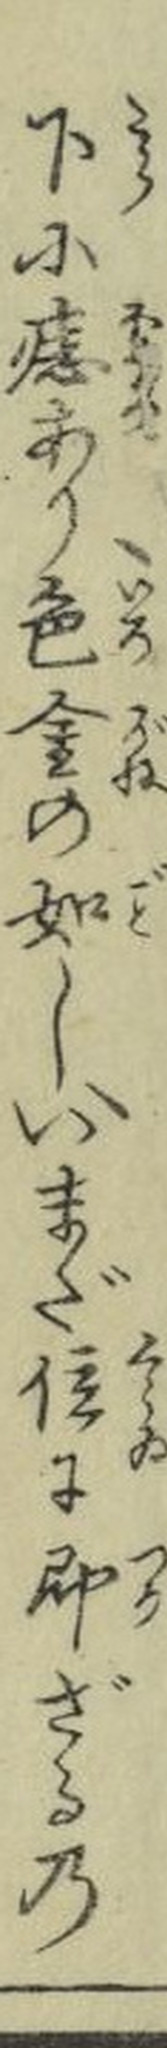下に痣あり、色金の如し、いまだ位に即ざるの
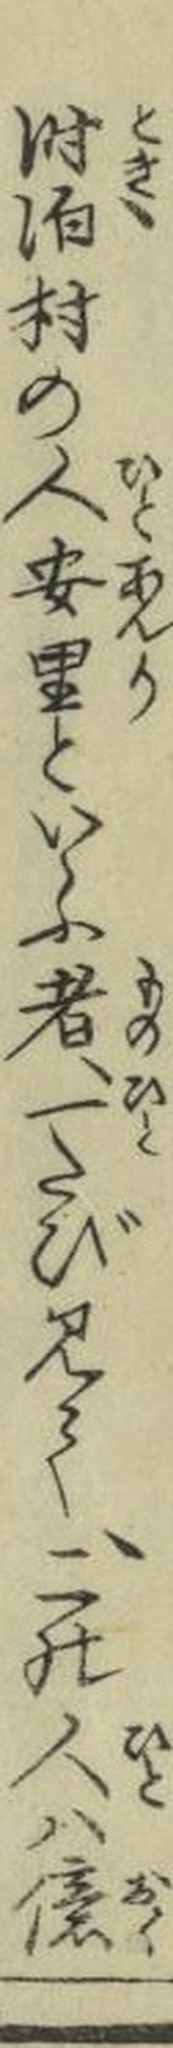時、泊村の人安里といふ者、一たび見て、この人は億
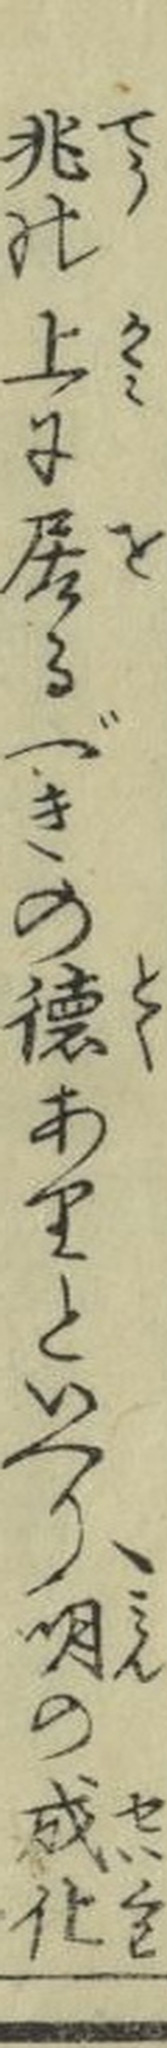兆の上に居るべきの徳ありといへり、明の成化
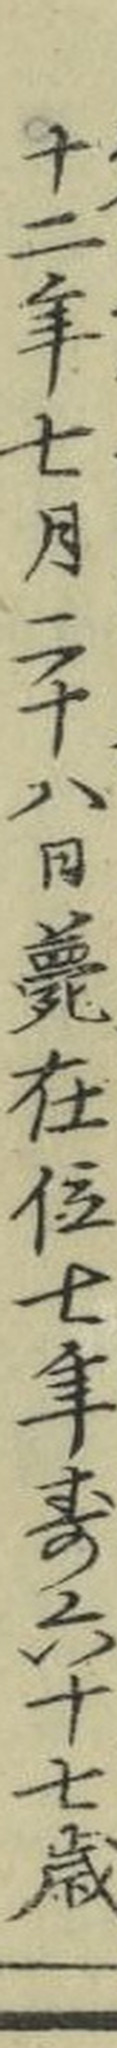十二年七月二十八日薨、在位七年寿六十七歳、
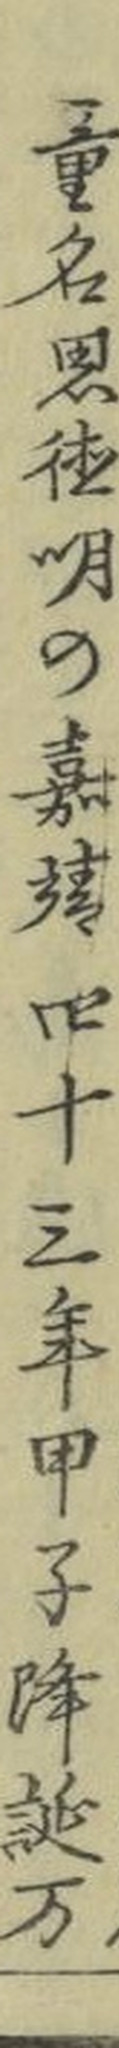童名思徳、明の嘉靖四十三年甲子降誕、万
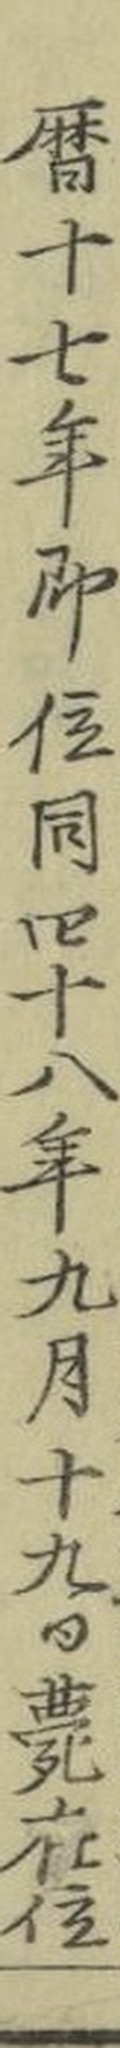暦十七年即位、同四十八年九月十九日薨、在位
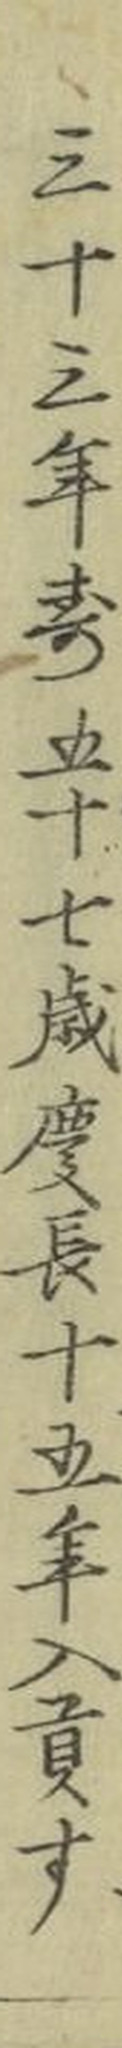三十三年、寿五十七歳、慶長十五年入貢す、

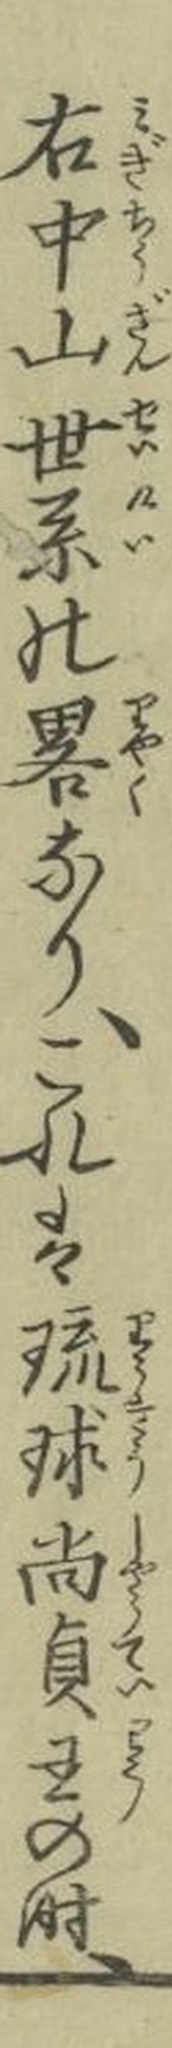右中山世系の略なり、これは琉球尚貞王の時、
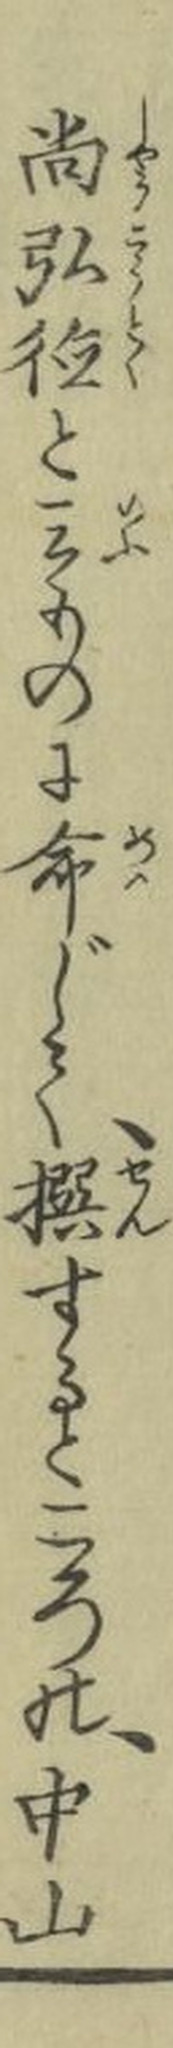尚弘徳と云ものに命じて、撰するところの、中山
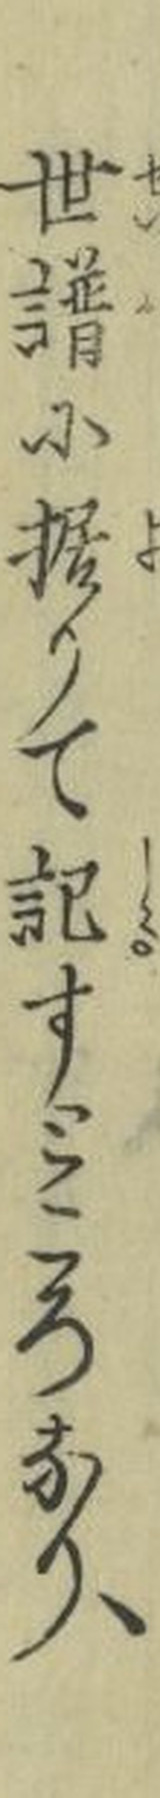世譜に据りて記すところなり、
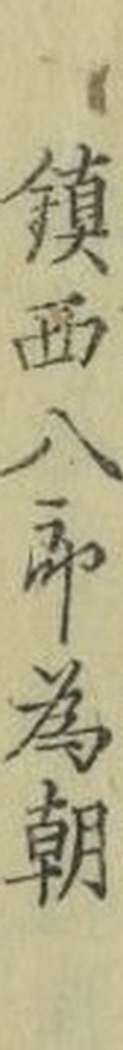鎮西八郎為朝
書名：琉球入貢紀略
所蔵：University of the Ryukyus Library
